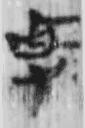史
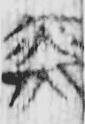炎
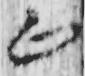㠯（以）
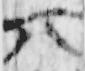亓
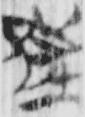○（兄）
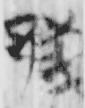○（蔡）
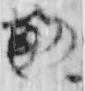○（斷）
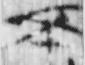不
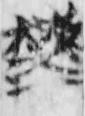灋
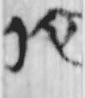佗
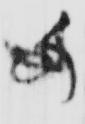爲
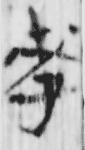李
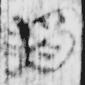𨟻（將）
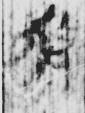須
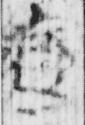達
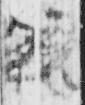執
